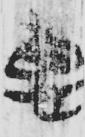惪（德）
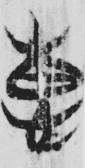惠
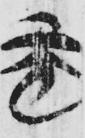而
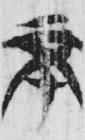不
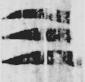三
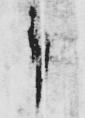十
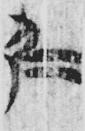仁
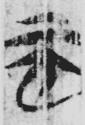而
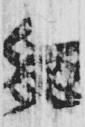能
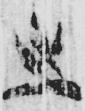之
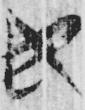女（如）
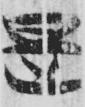是
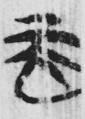而
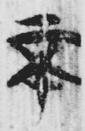不
